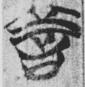善
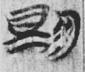則
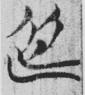從（從）
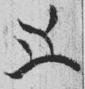之
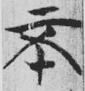不
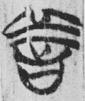善
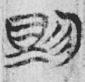則
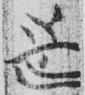歨
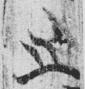之
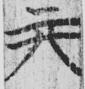而
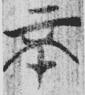不
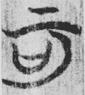可
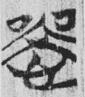○（憐）
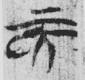而
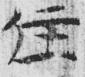任
